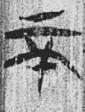不
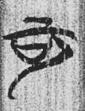可
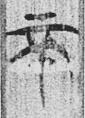不
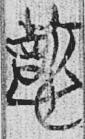{十言斤心}（慎）
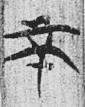不
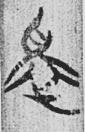卒B（卒）
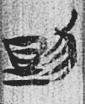則
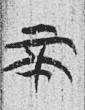不
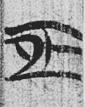亙
